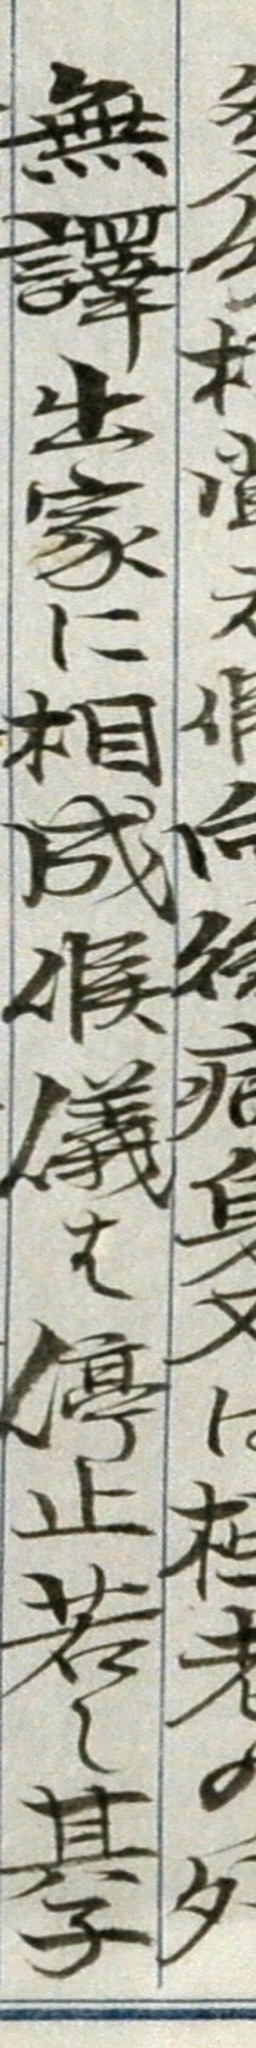無訳出家に相成候儀は停止若し其子
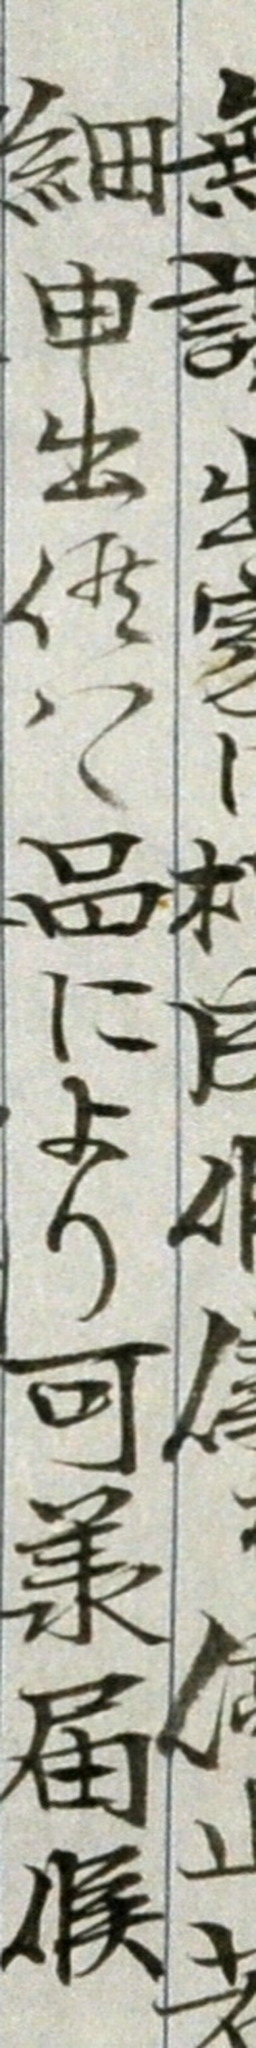細申出候ハヽ品により可承届候
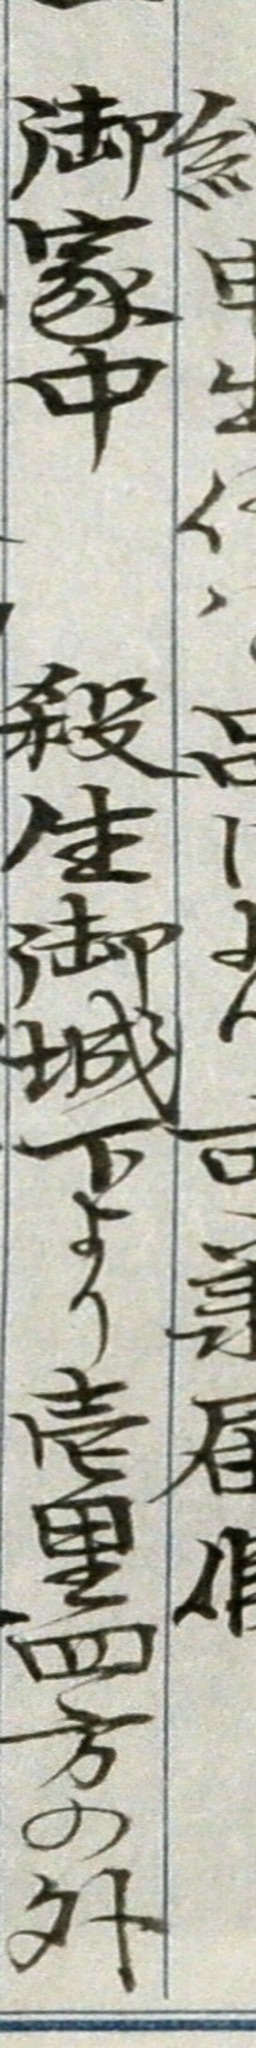一御家中殺生御城下より壱里四方の外
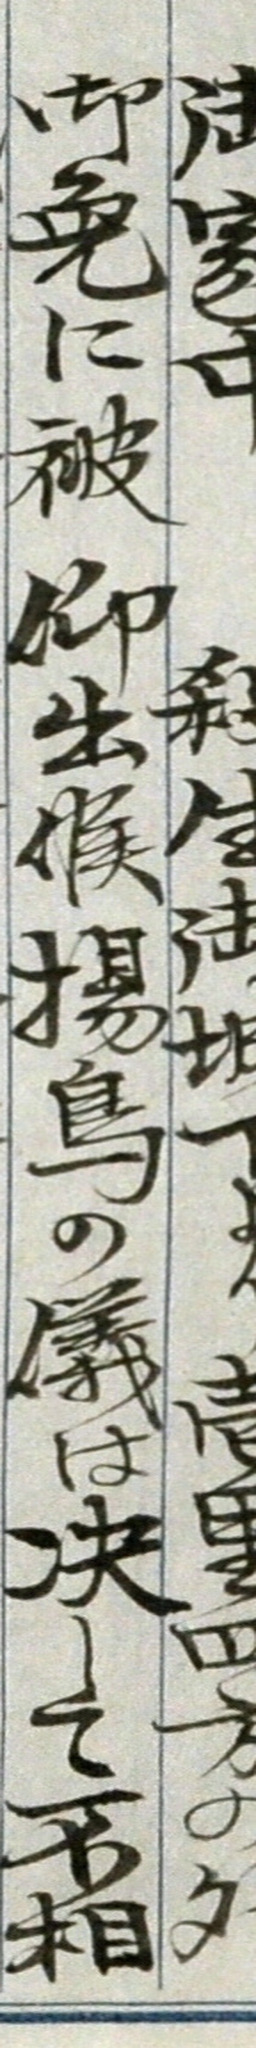御免に被仰出候揚鳥の儀は決して不相
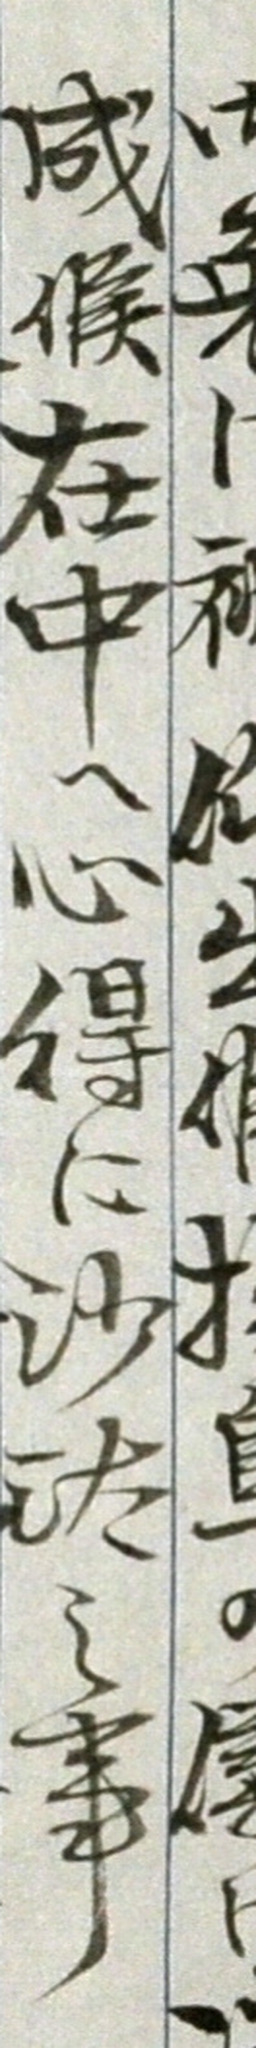成候在中へ心得に沙汰之事
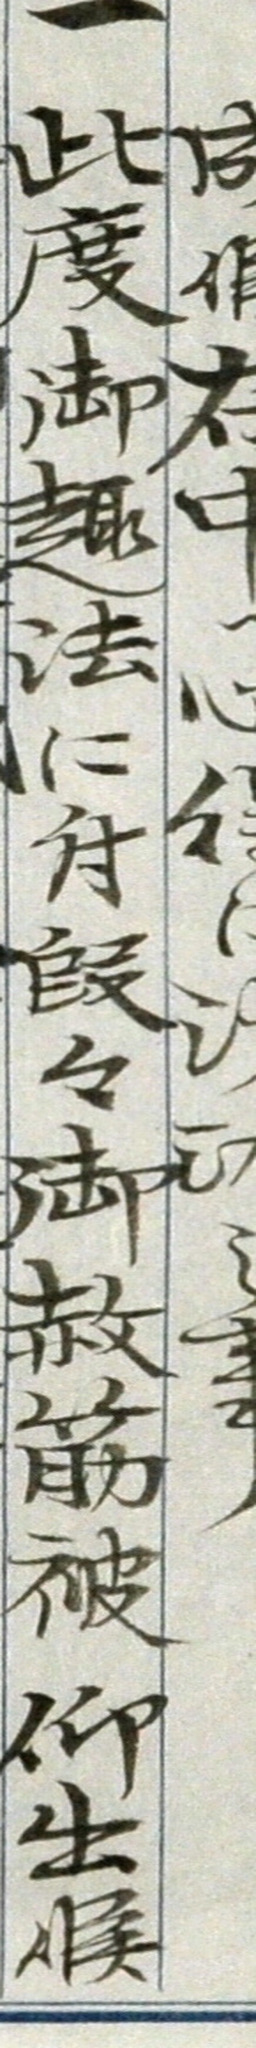一此度御趣法に付段々御赦筋被仰出候
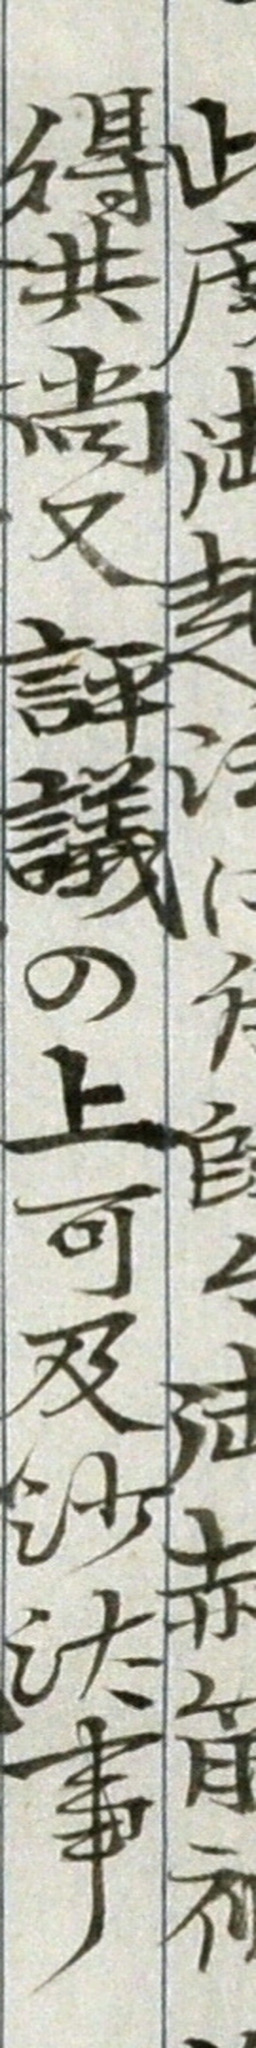得共尚又評議の上可及沙汰事
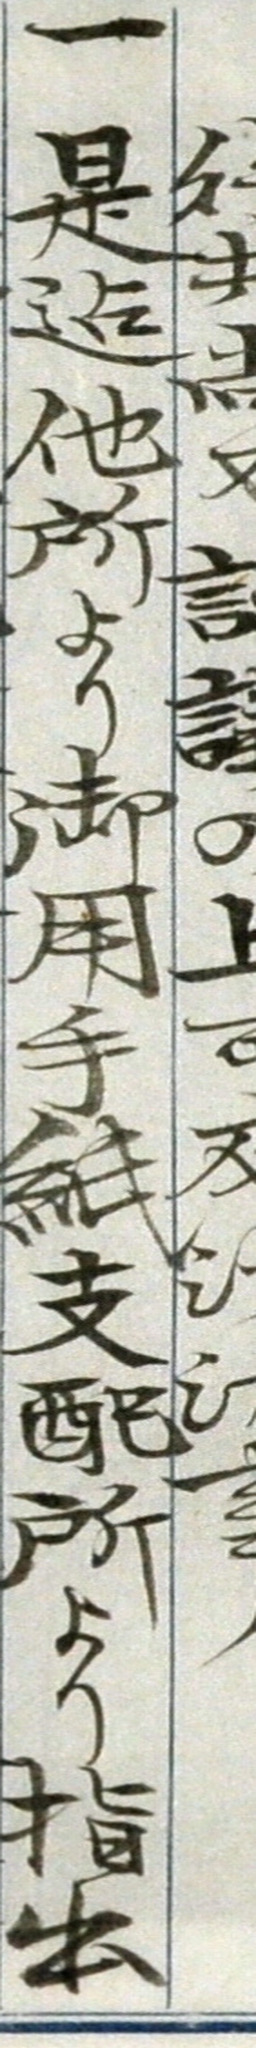一是迄他所より御用手紙支配所より指出
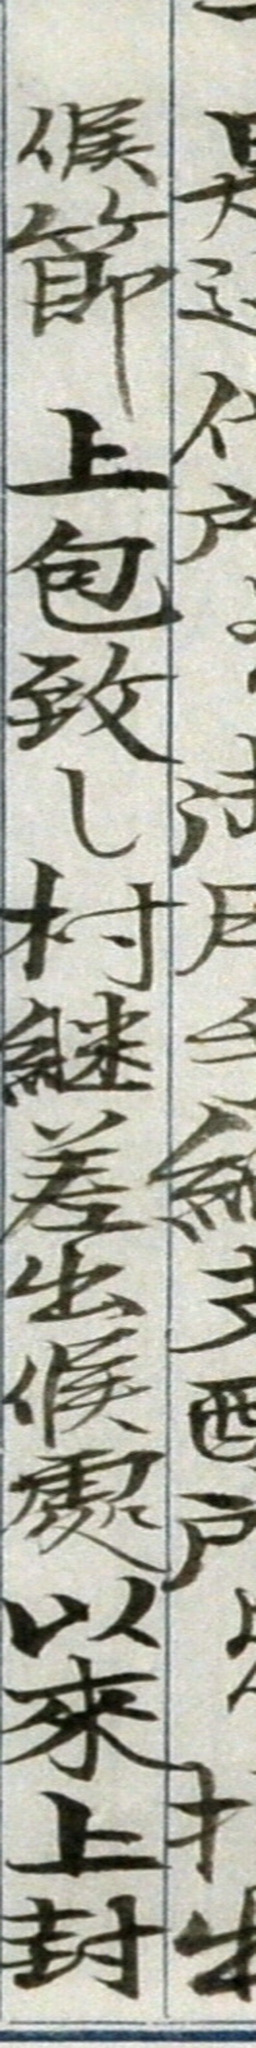候節上包致し村継差出候処以来上封
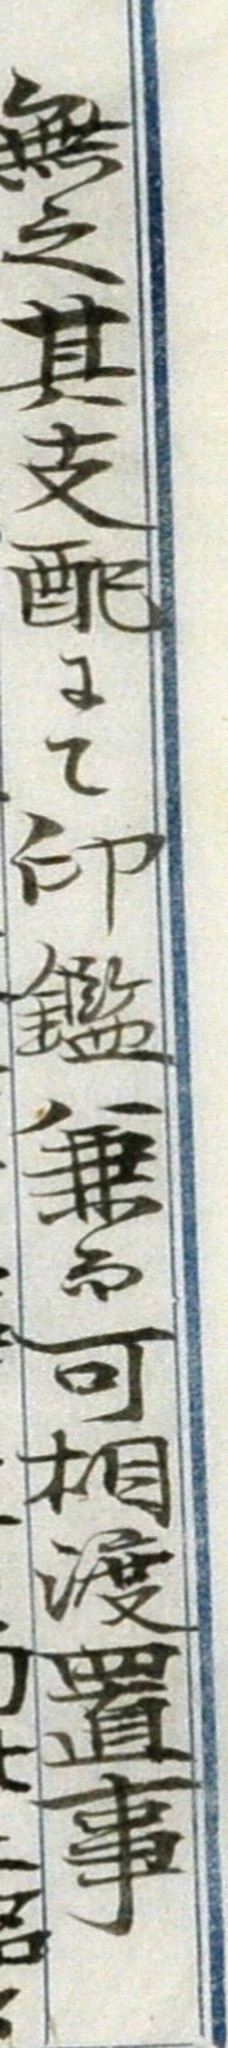無之其支配にて印鑑兼而可相渡置事
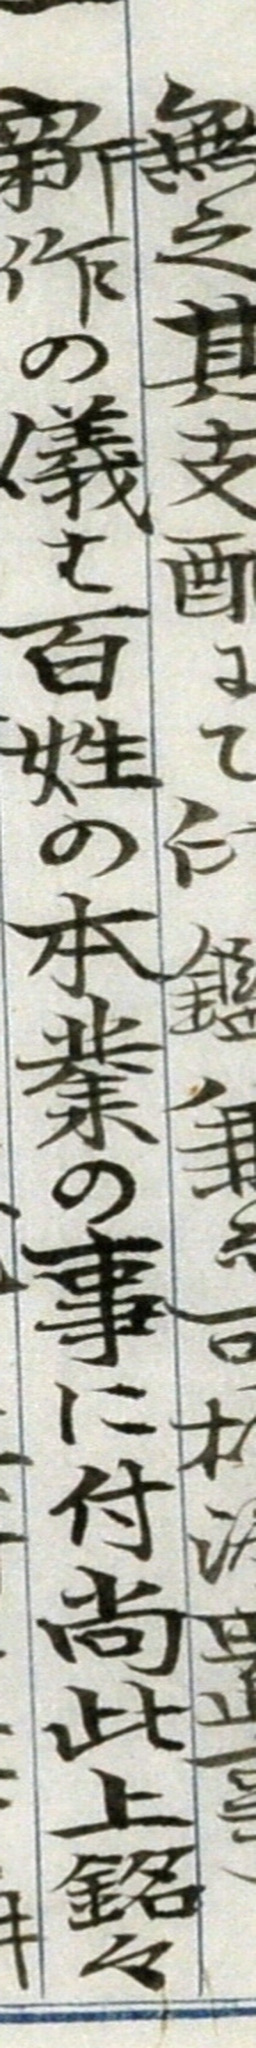一新作の儀は百姓の本業の事に付尚此上銘々
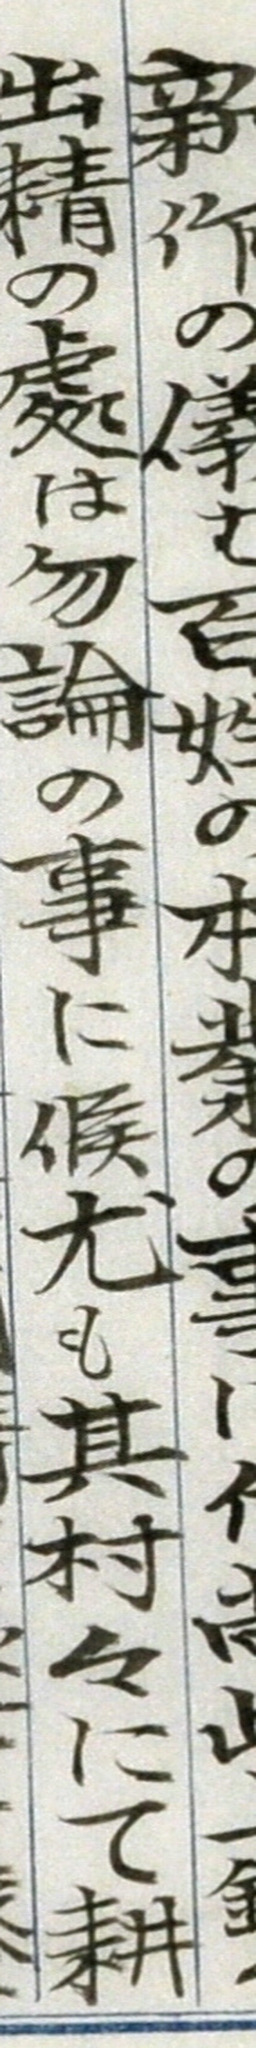出精の処は勿論の事に候尤も其村々にて耕
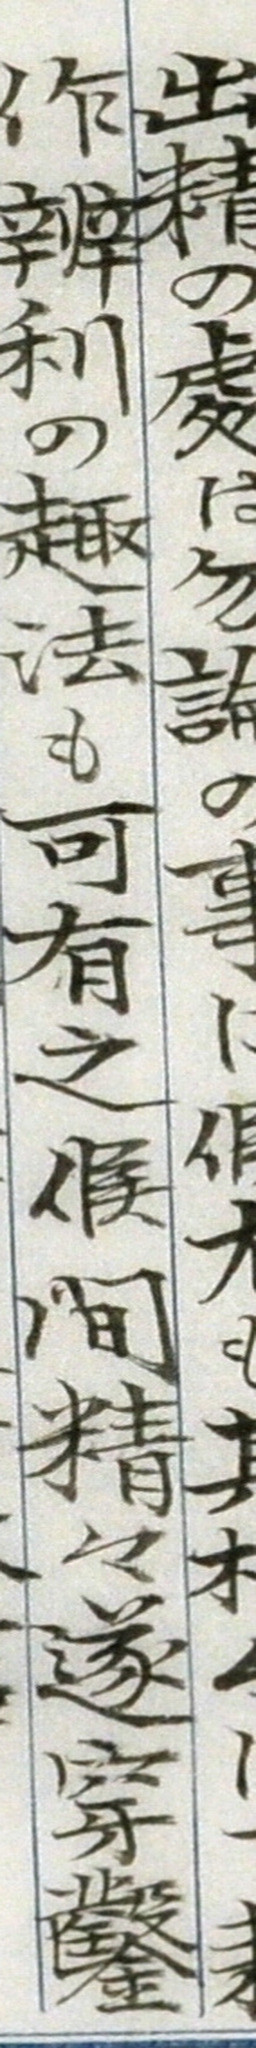作弁利の趣法も可有之候間精々遂穿鑿
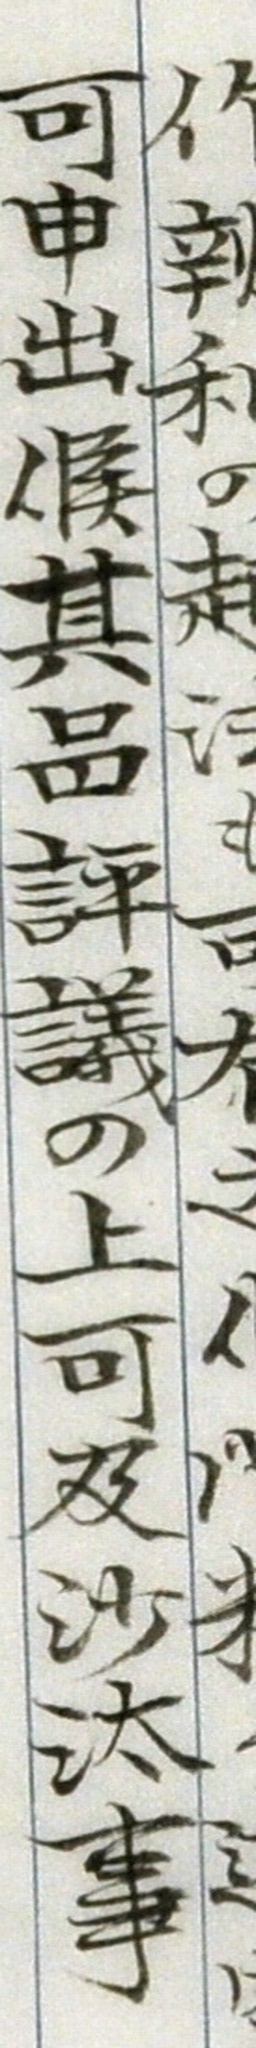可申出候其品評議の上可及沙汰事
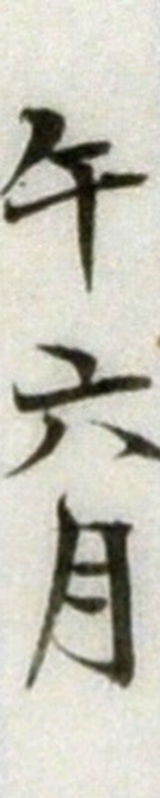午六月

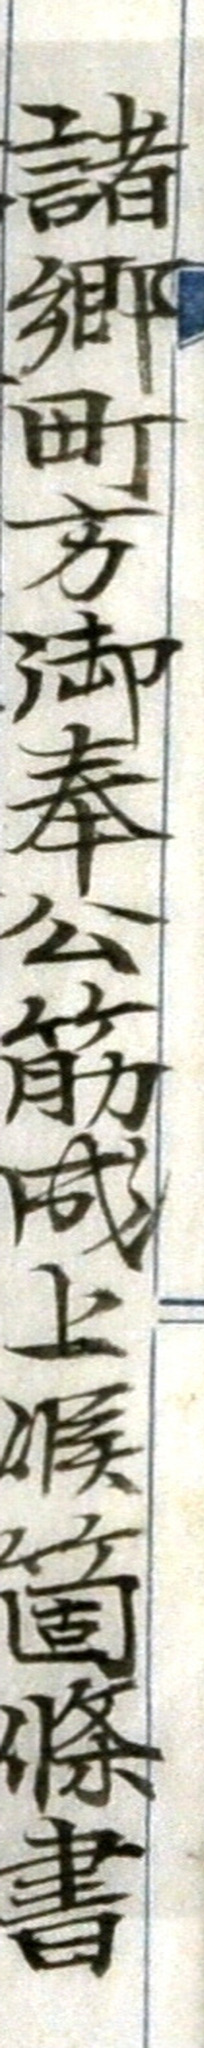諸郷町方御奉公筋成上候箇条書
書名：倹約筋御沙汰書
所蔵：伊那市立高遠町図書館・合同会社AMANE
